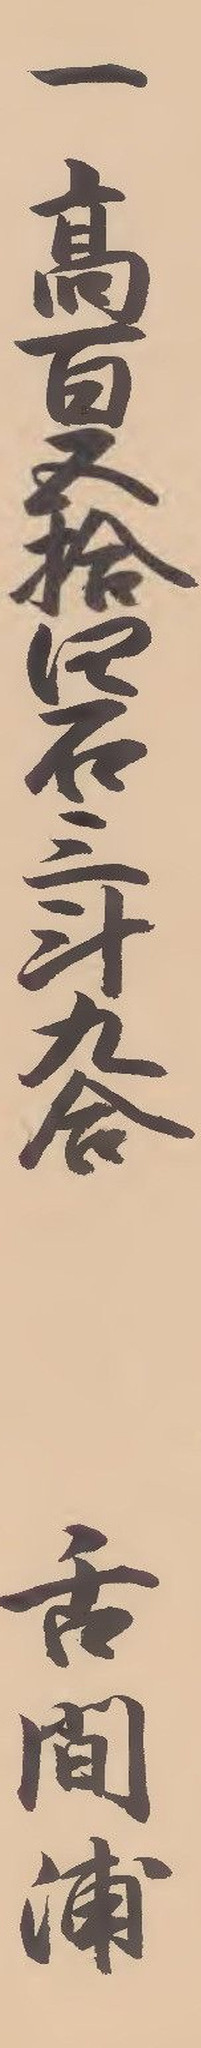一高百五拾四石三斗九合舌間浦

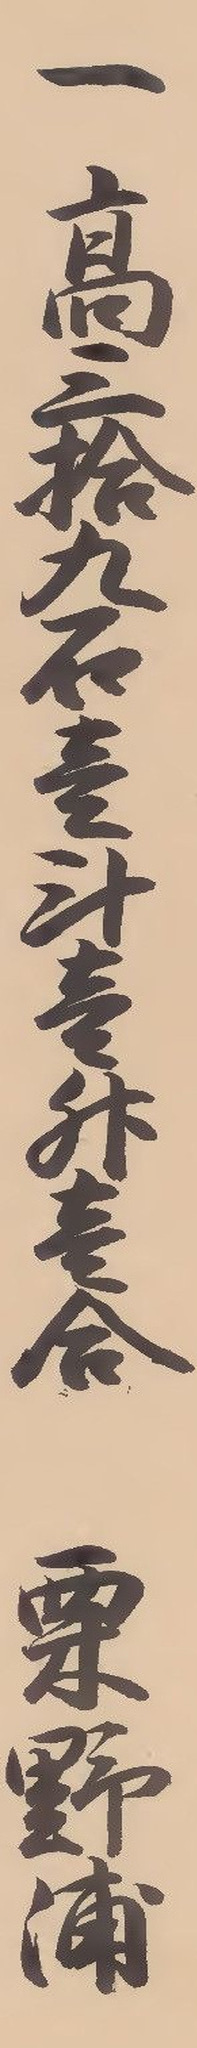一高三拾九石壱斗壱升壱合栗野浦
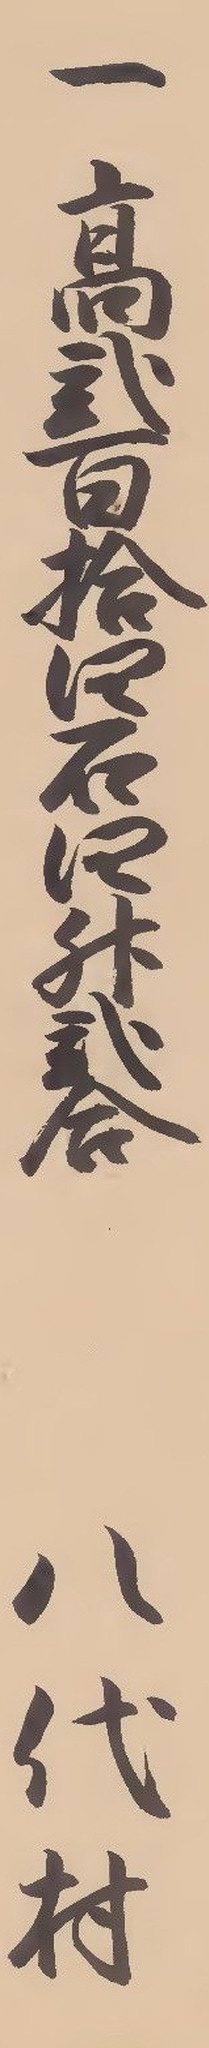一高弐百拾四石四升弐合八代村
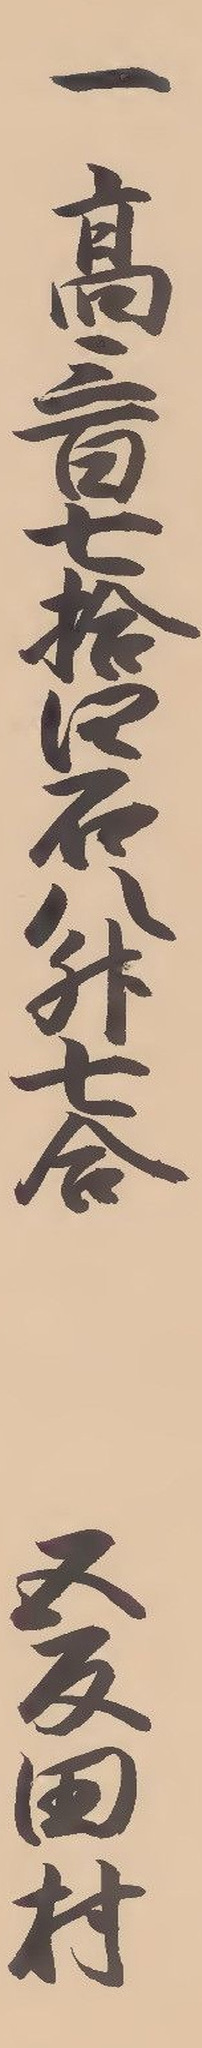一高三百七拾四石八升七合五反田村
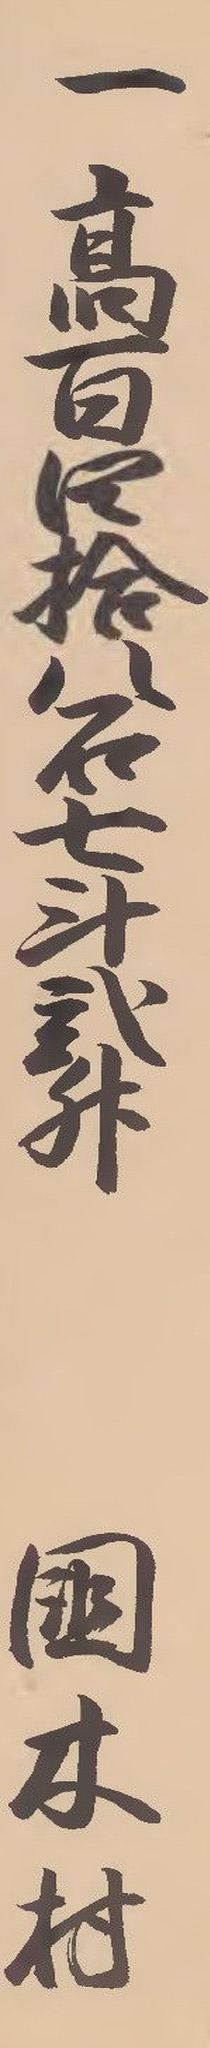一高百四拾八石七斗弐升国木村
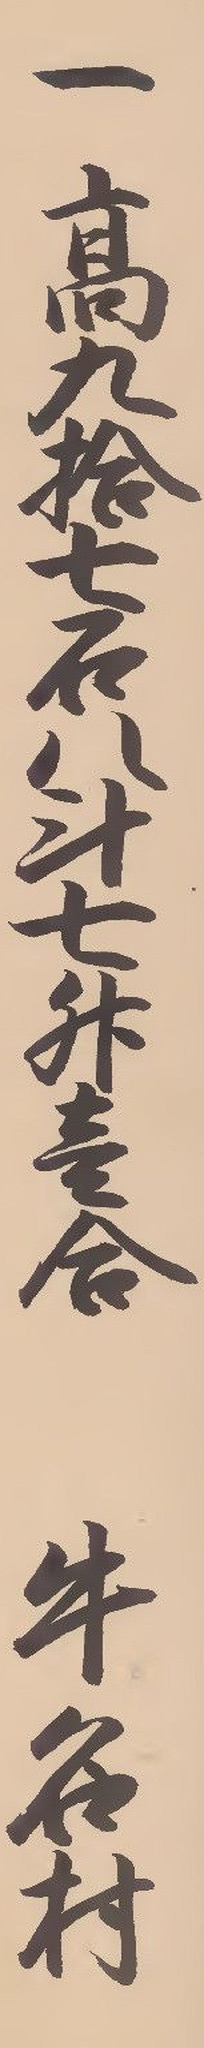一高九拾七石八斗七升壱合牛名村
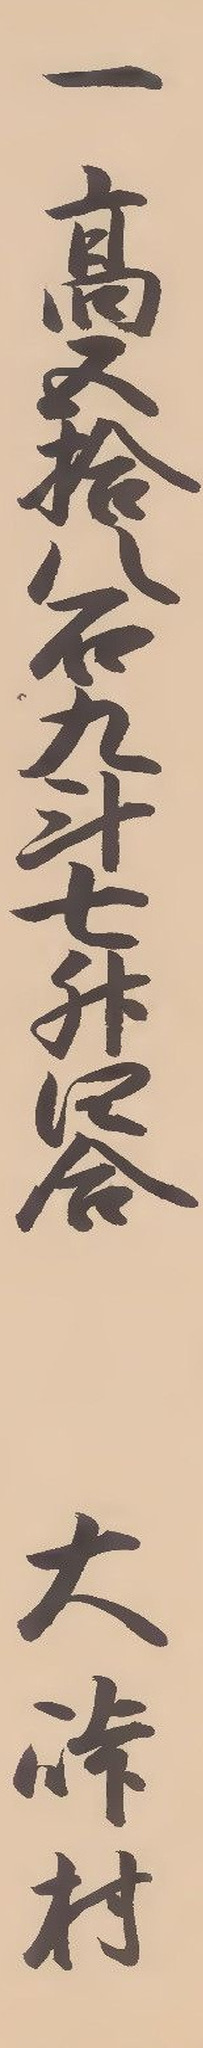一高五拾八石九斗七升四合大峠村
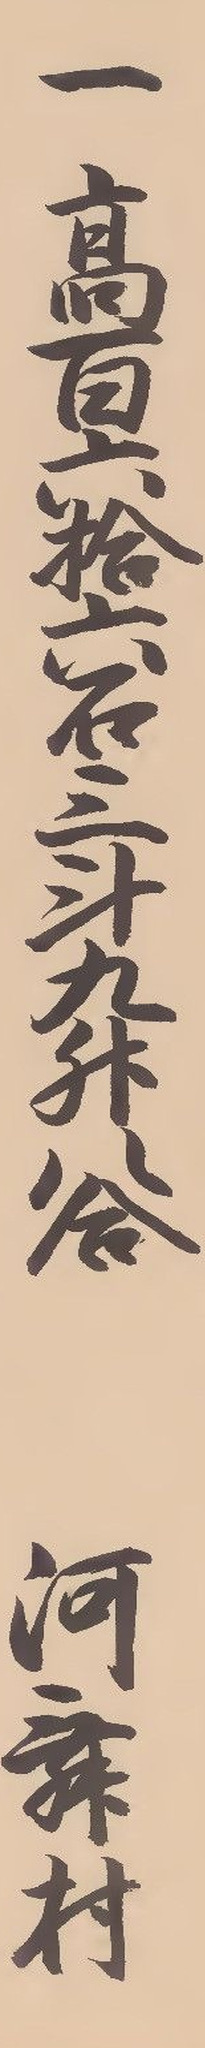一高百六拾六石三斗九升八合河舞村
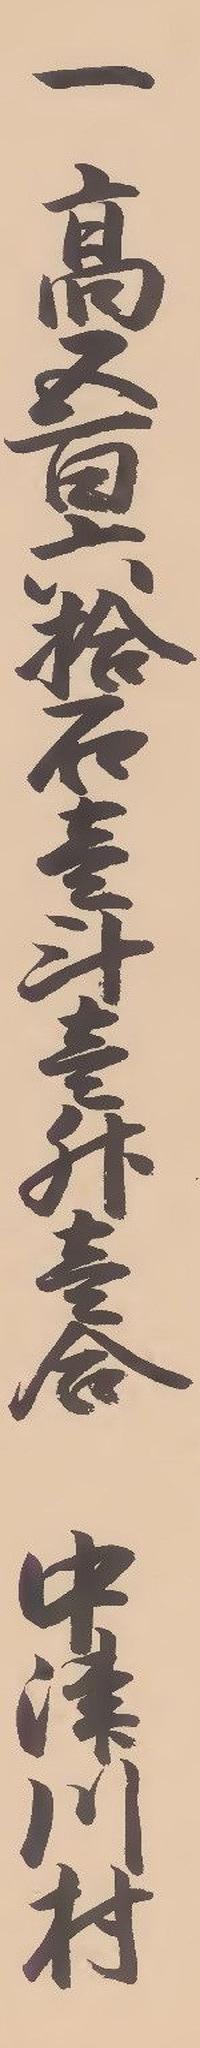一高五百六拾石壱斗壱升壱合中津川村

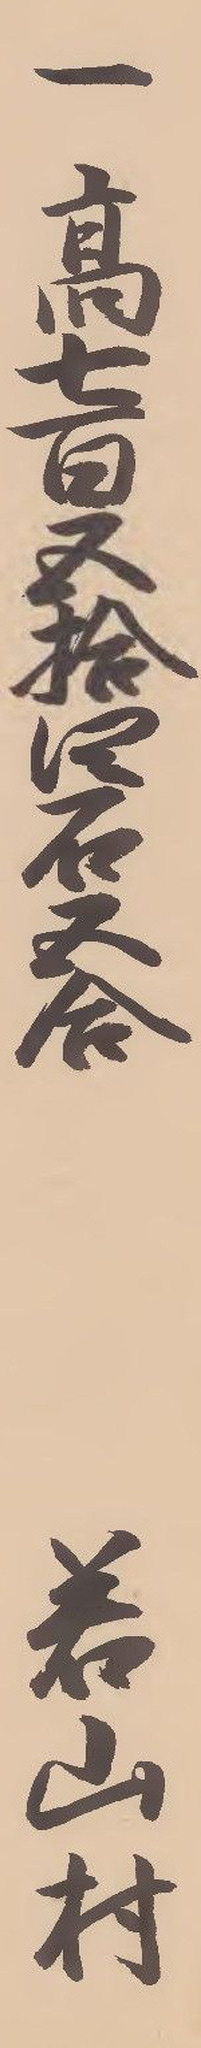一高七百五拾四石五合若山村
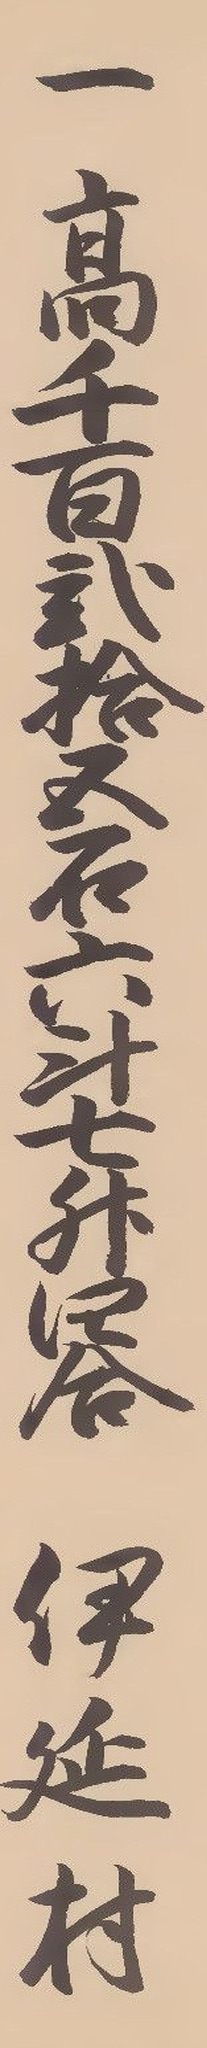一高千百弐拾五石六斗七升四合伊延村
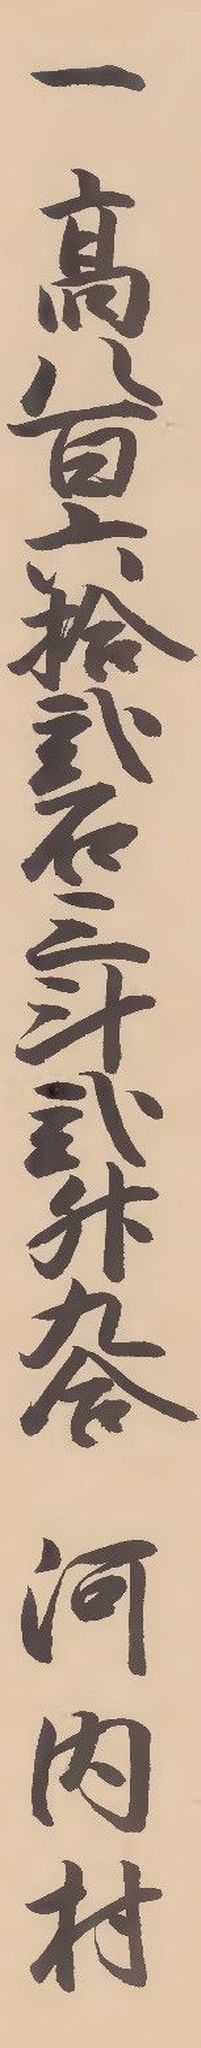一高八百六拾弐石三斗弐升九合河内村
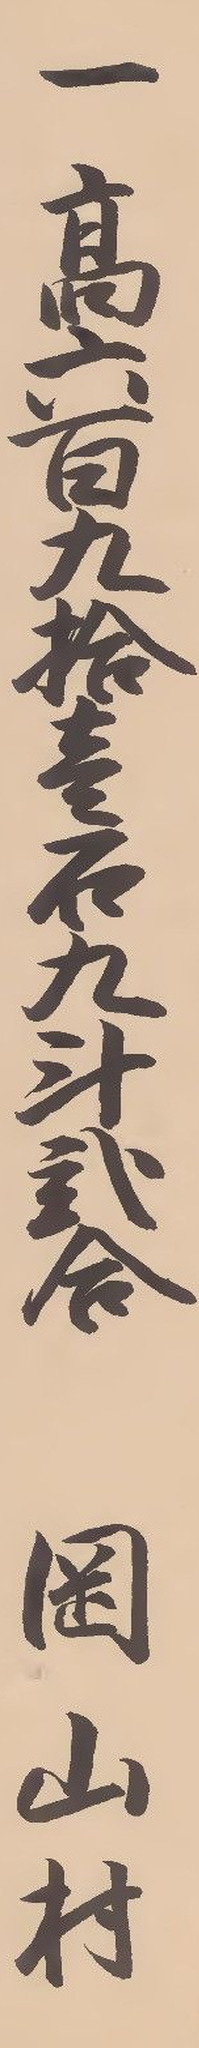一高六百九拾壱石九斗弐合岡山村
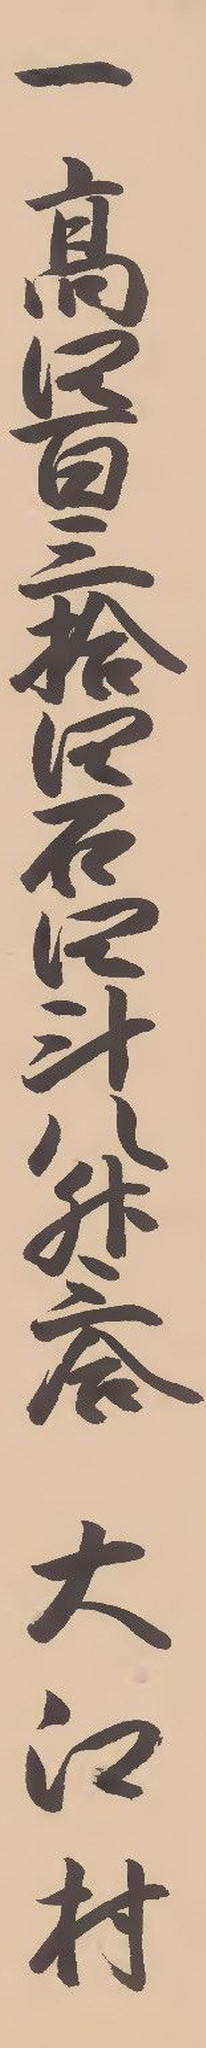一高四百三拾四石四斗八升三合大江村
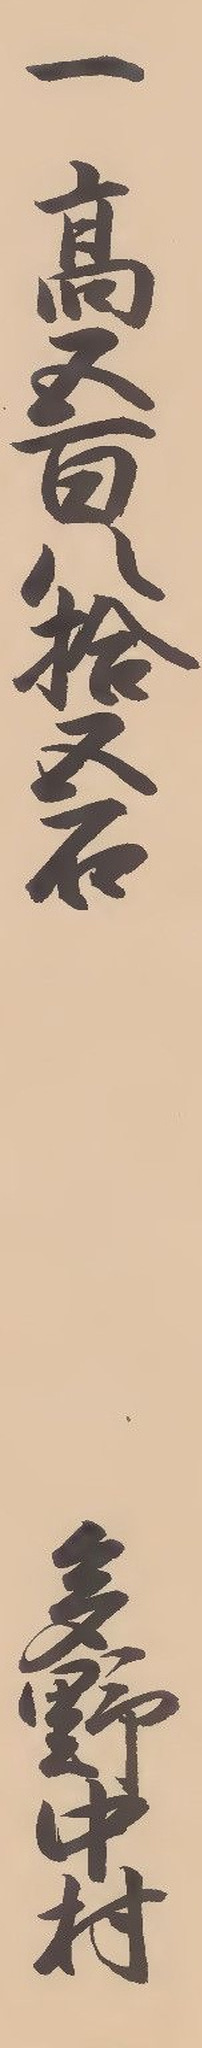一高五百八拾五石多野中村
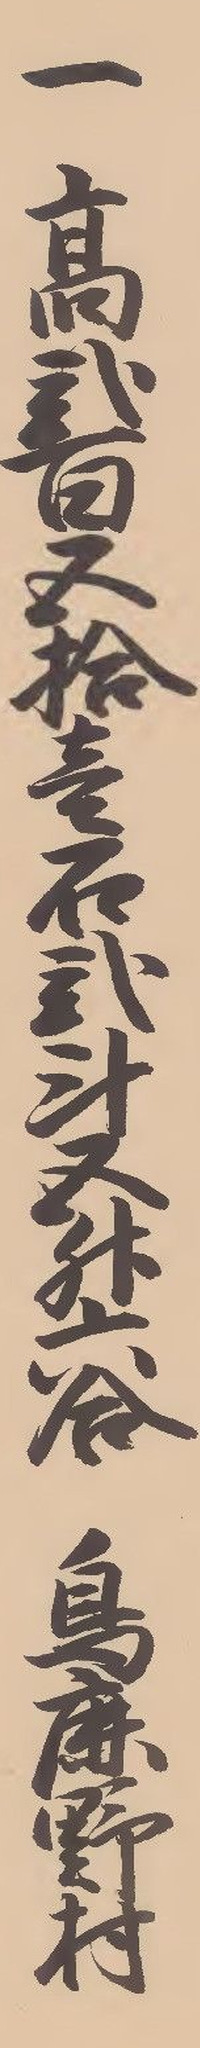一高弐百五拾壱石弐斗五升六合鳥鹿野村
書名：伊予国郷帳
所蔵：国立公文書館 National Archives of Japan
